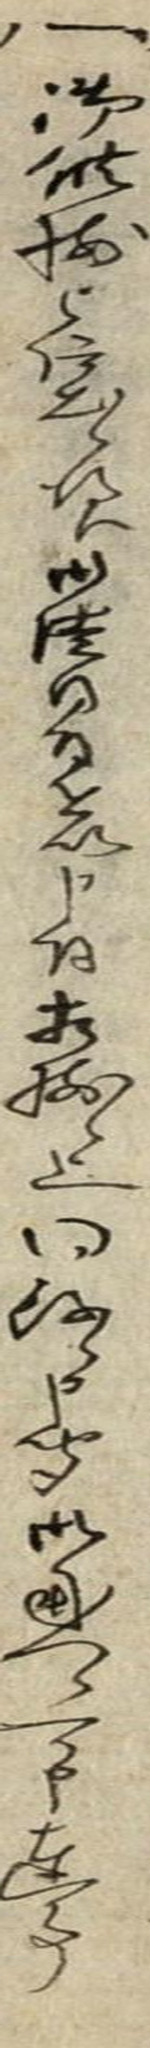一御供揃被仰出候得は御徒目付を以申付相揃候上同役へ申聞御用人へ可申達事
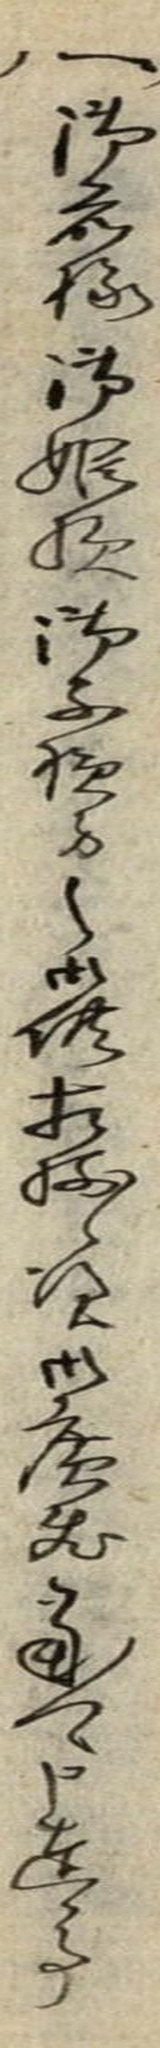一御前様御姫様御子様方之御供相揃候得は御広敷御用人へ申達候事
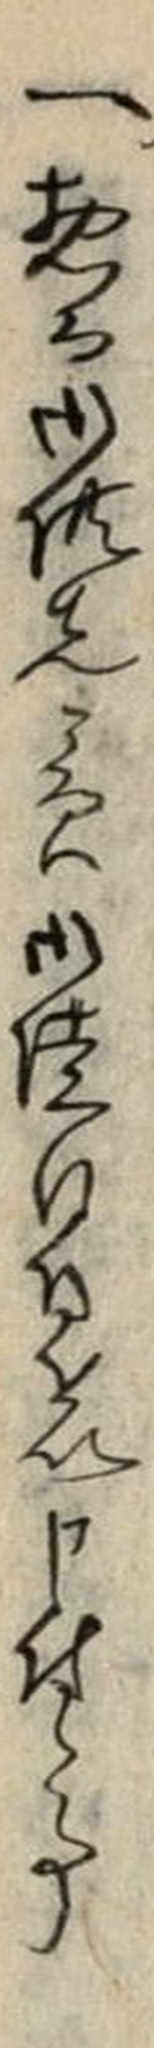一惣て御供先にては御徒目付を以申付候事
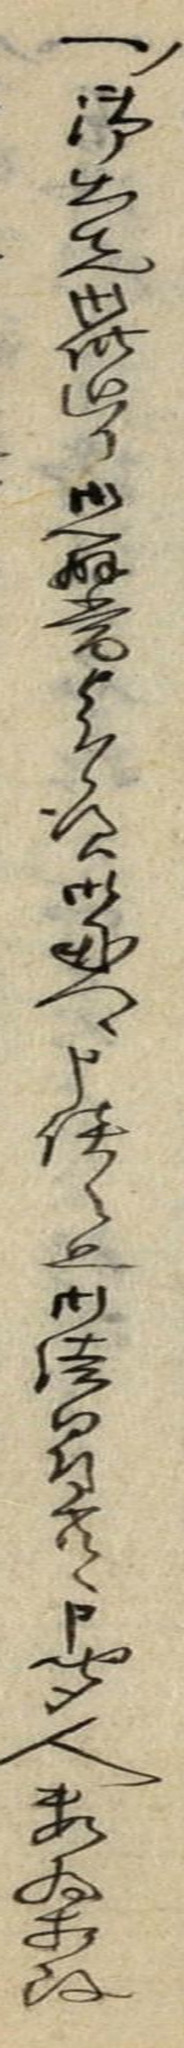一御出先御供廻り御弁当被下候得は御用人へ申談之上御徒目付共へ申聞人数為相改
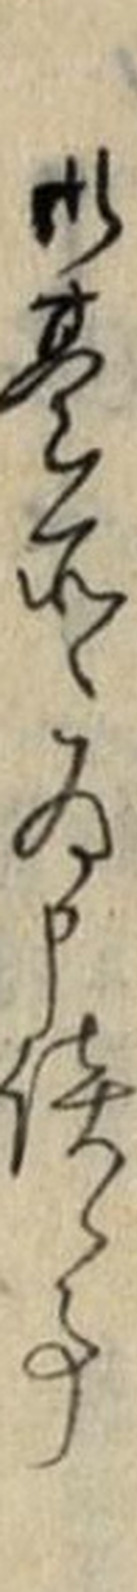御台所へ為申談候事
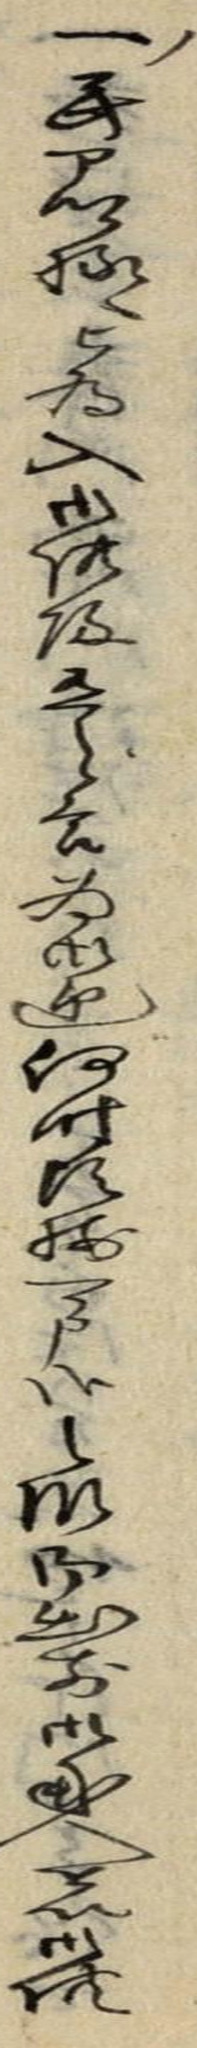一民部卿様へ被為入御供帰有之候節為御迎何時頃揃可申哉之段御出前御用人を以御供
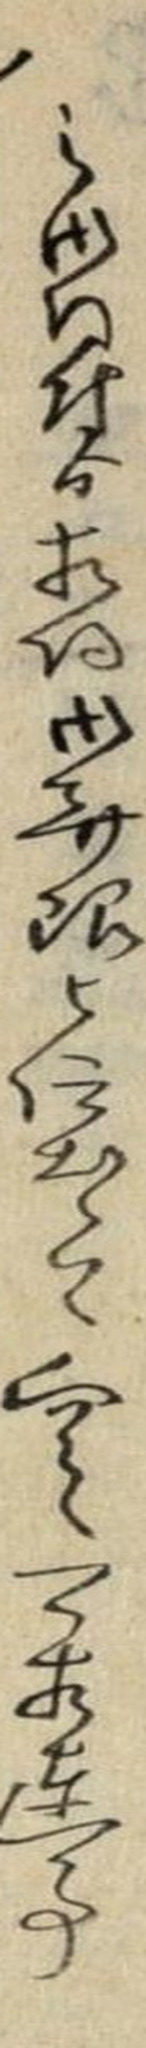之御目付ゟ相伺御刻限被仰出候はゝ向々へ可相達事
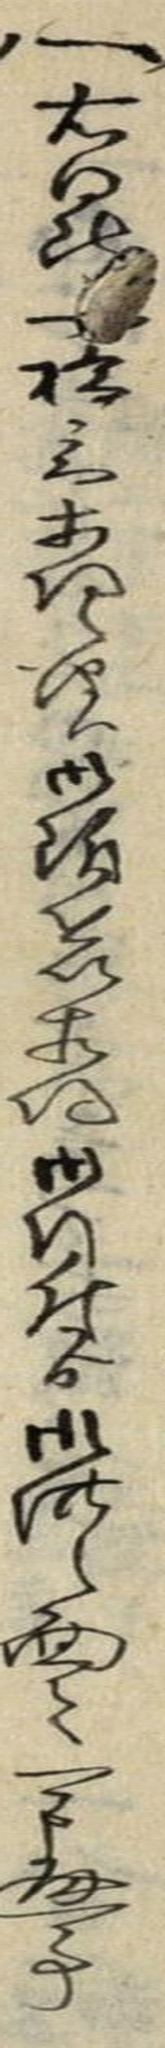一右同断一橋にて相伺候儀は御附を以相伺御目付ゟ御供之面々へ可申通事
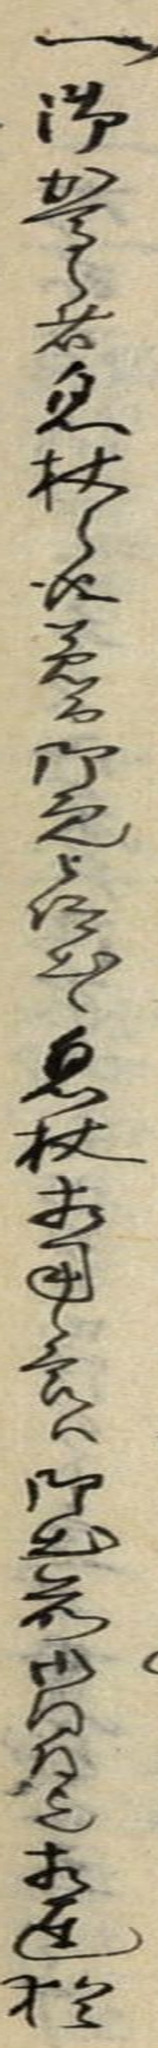一御駕之者息杖之儀兼て御免被仰出候息杖相用候節は御出前御目付迄相達猶
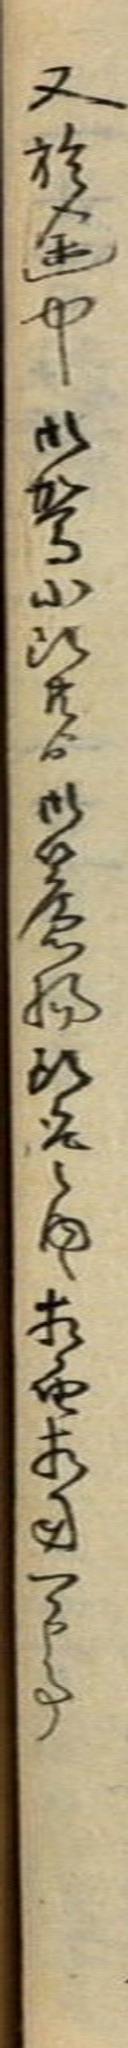又於途中御駕小頭共ゟ御簾揚頭取之内へ相届相用可申事
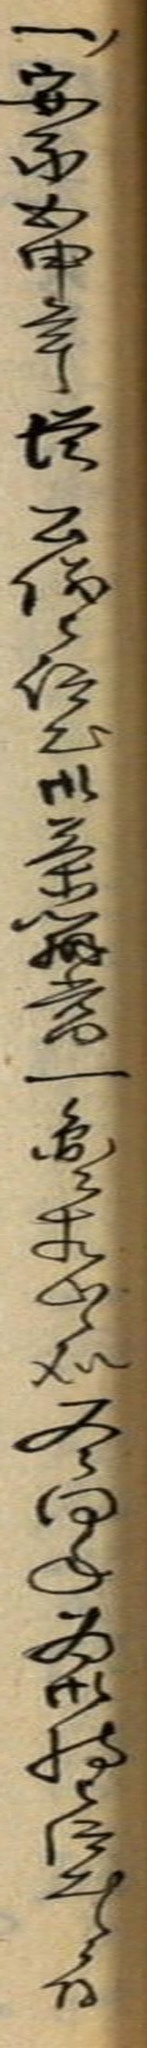一安永五申年従公儀被仰出御茶弁当一円に相止候処又々同年為御持被仰出候に付
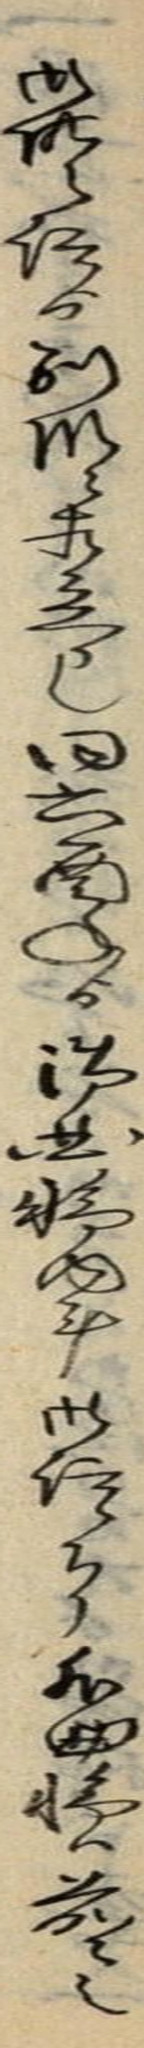御供之跡ゟ別段に相立申候同六酉年ゟ御曲輪内計御跡へ下り外曲輪は前々之通
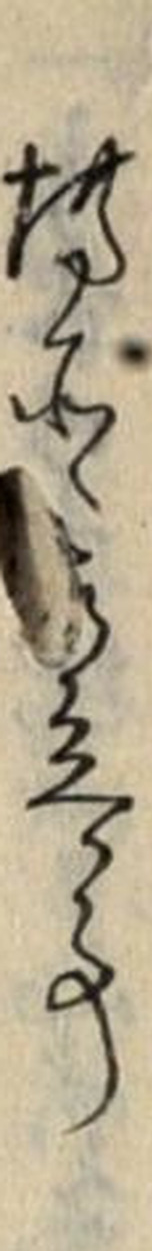場所へ相立候事
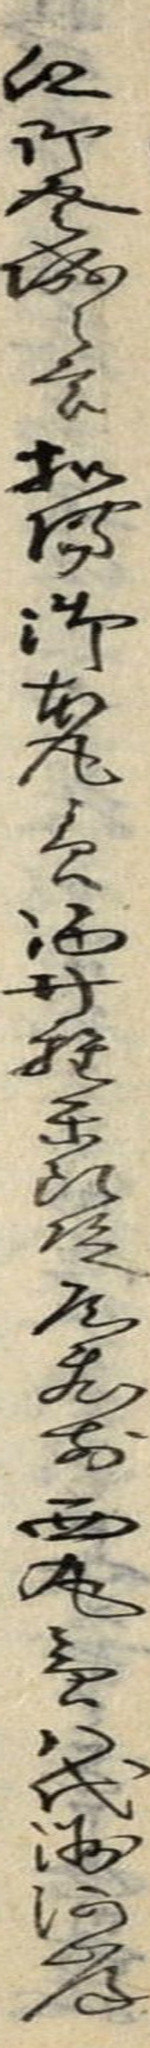但御登城之節扣場御本丸にては酒井雅樂頭殿屋敷前西丸にては八代洲河岸
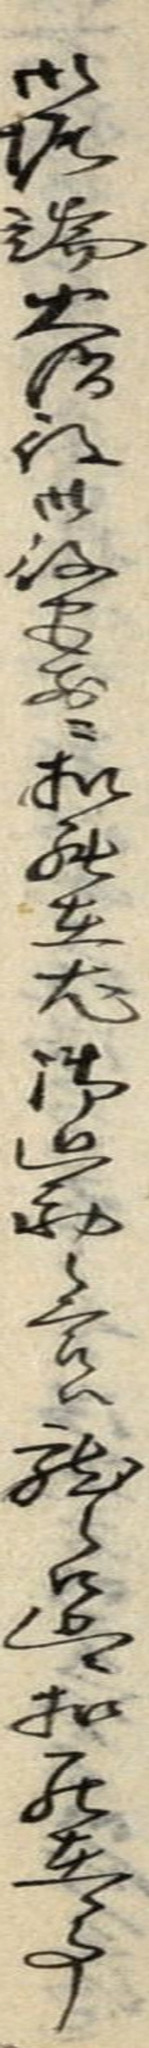御堀端火消役御役宅前に扣罷在尤御廻勤之節は龍之口辺に扣罷在候事
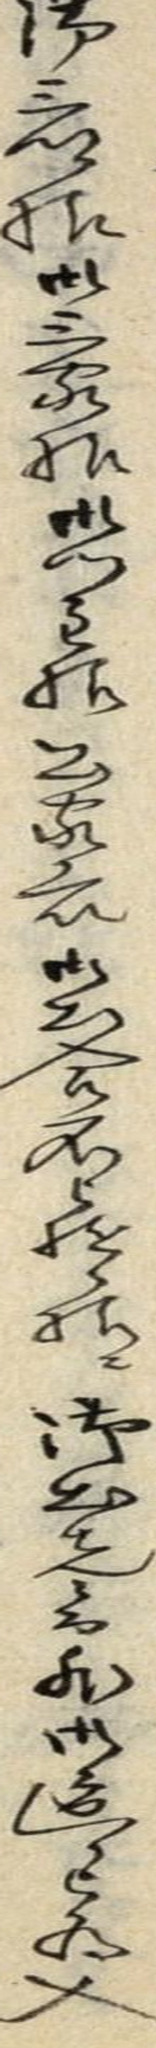一御三卿様御三家様御門主様公家衆御出合不被遊候様に御出先にて外御道へ被為入
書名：三都并道中之部
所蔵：福井県文書館 Fukui Prefectural Archives
